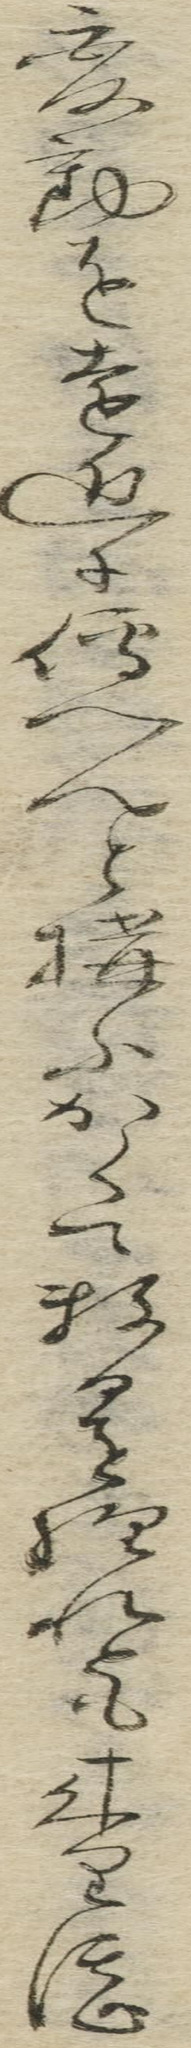変動を遠近に伝へんと構ふかくて数日を経れとも成り湛
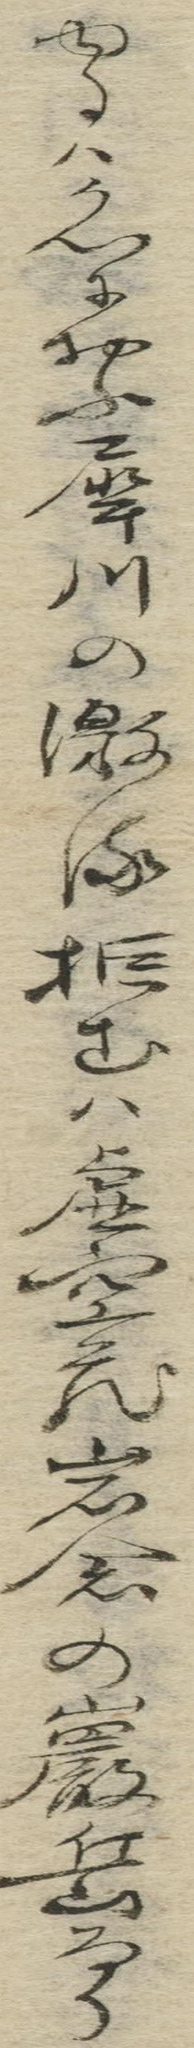ゆるハかんにおふ犀川の激流拒むハ虚空蔵岩倉の巖岳なり

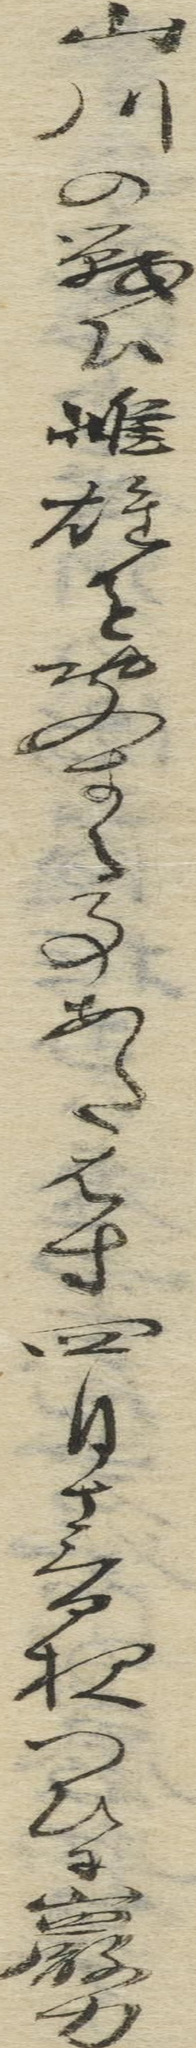山川の戦ひ雌雄を決する事あたはす四月十三日夜つひに巖力
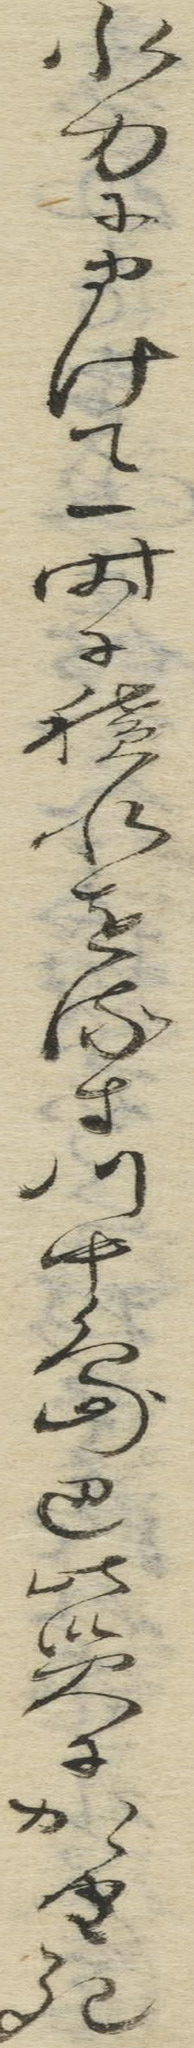水力にまけて一時に積水を流す川中島辺此災にかゝり死
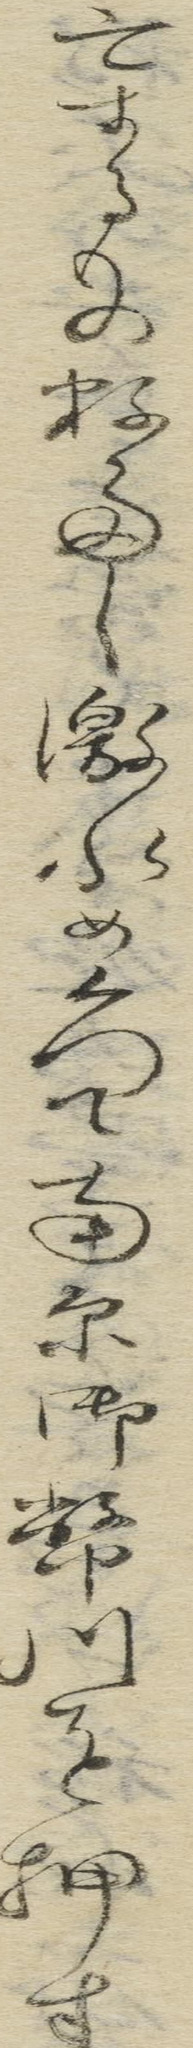亡するもの数多し激水めくつて南原御弊川を押す
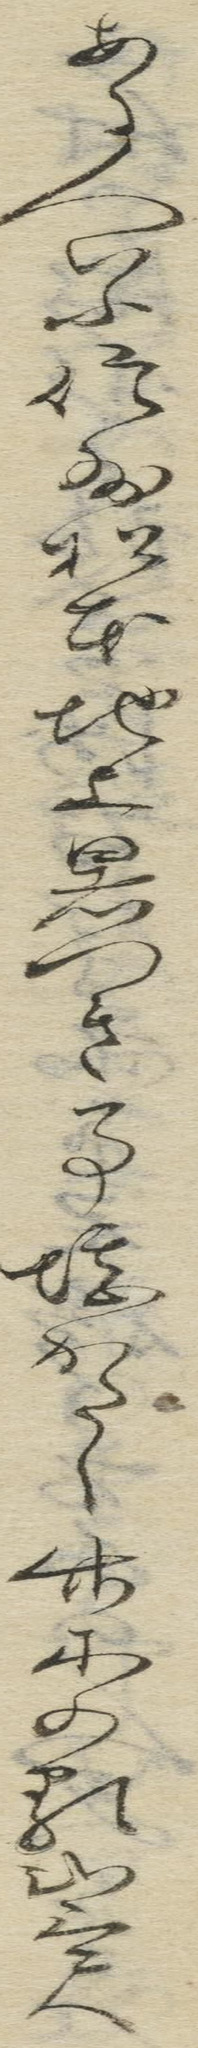ある人いふ信州松本地上暑つき事堪かたし竹木の類弐三尺
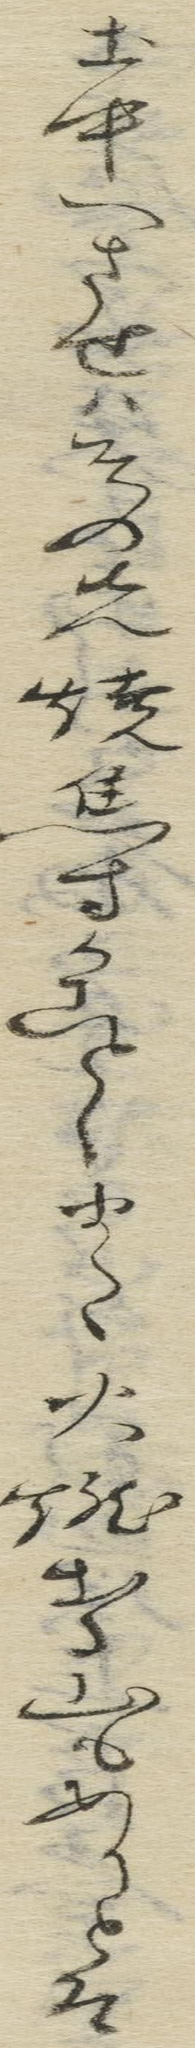土中へさせハその先焼焦すかことしまた〳〵火燃出る山もありとそ
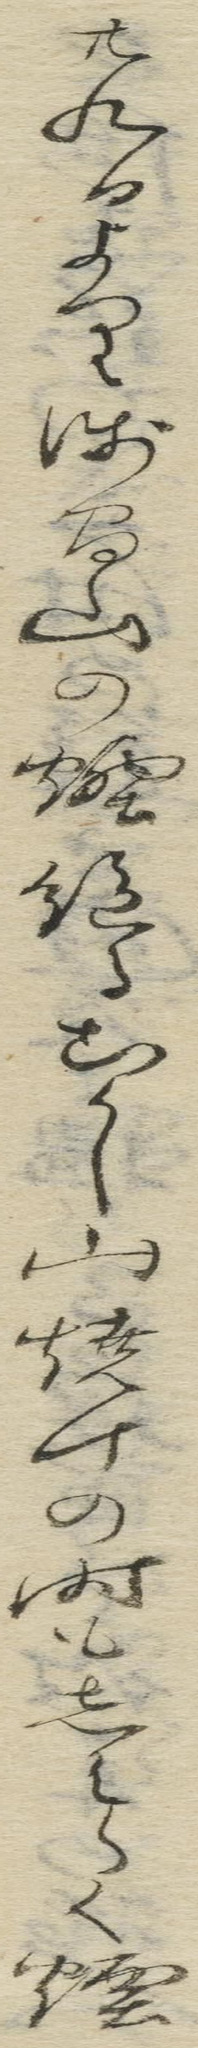廿九日より浅間山の煙絶るむかし山焼けの時もしはらく煙
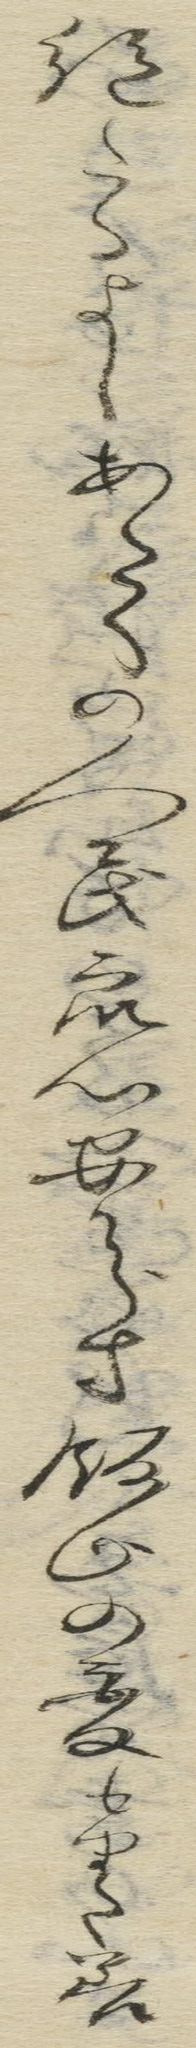絶たるよしあたりの人民衆心安からす飯山の変もまた善
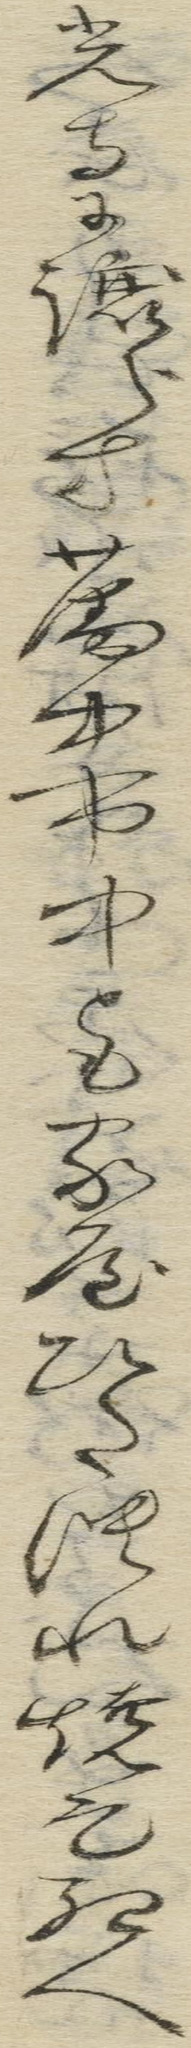光寺に譲らす藩中市中とも家屋ひた潰れ焼亡死人
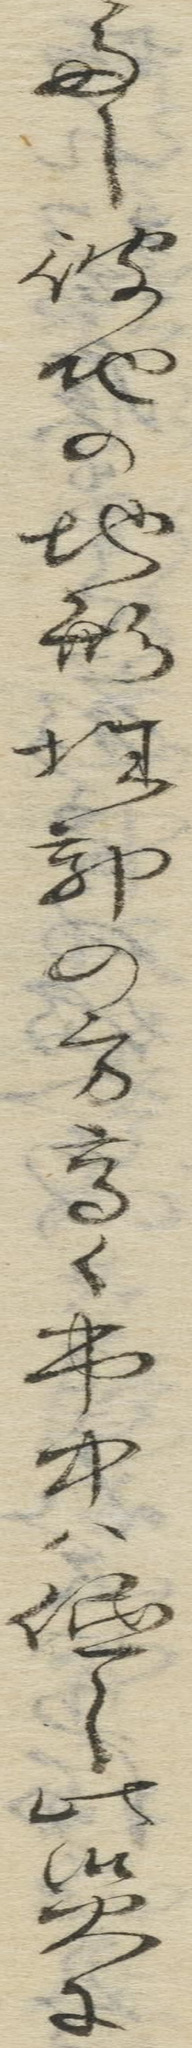多し彼地の地形城郭の方高く市中ハ低し此災に
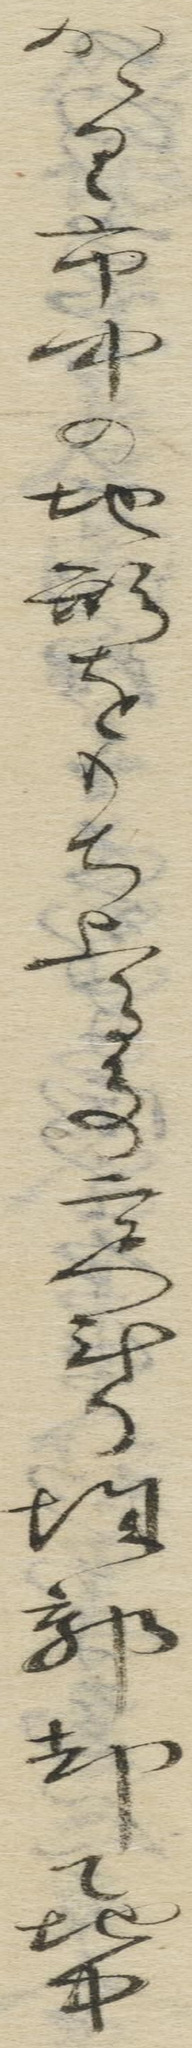かゝり市中の地形をもち上る事二尺計り城郭却て地中
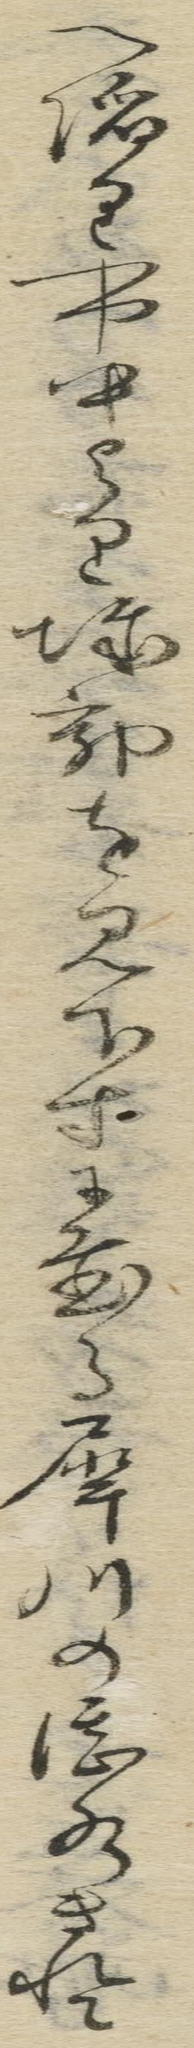へ陥り市中より城郭をみ下すに至る犀川の湛水きれて
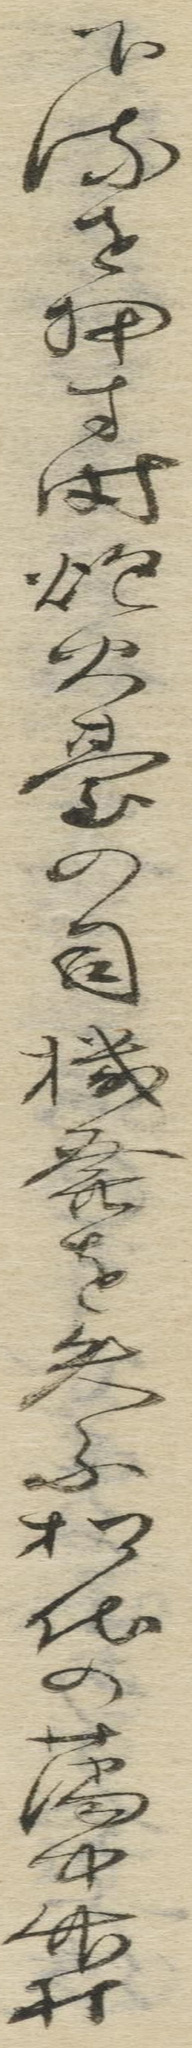下流を押す時炮火台の自機發を失ふ松代の藩中竹村
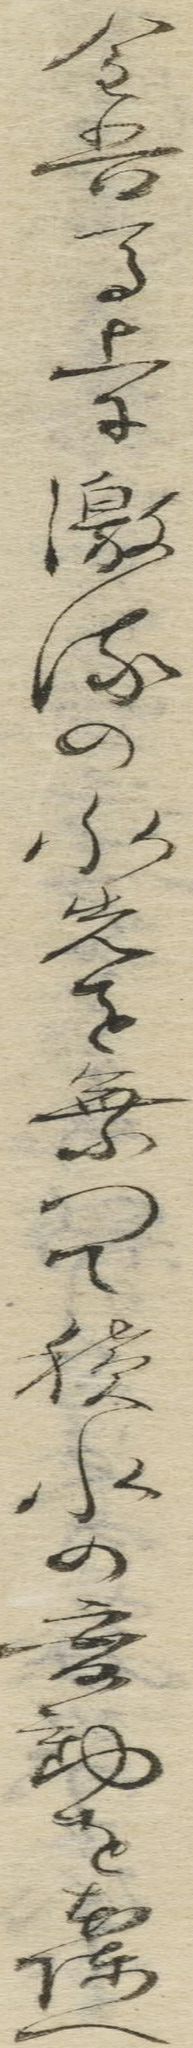金吾馬上に激流の水先を乗つて積水の変動を本陣へ
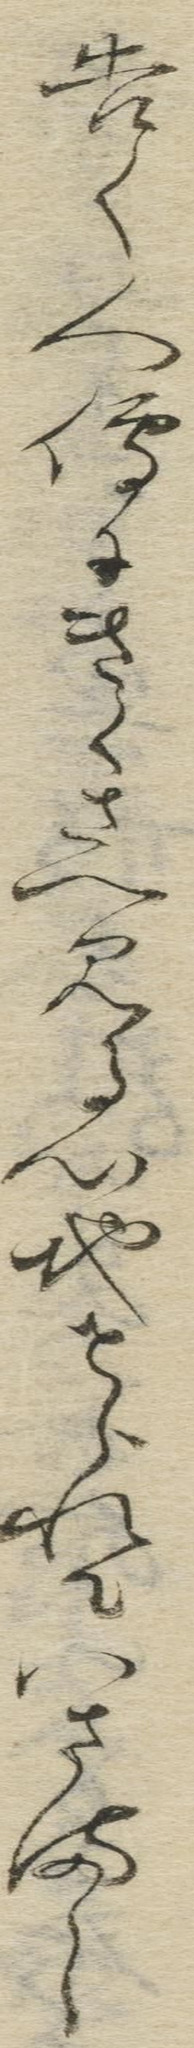告く人伝にきくさへ見る心地をられていさまし
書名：弘化丁未天變日記
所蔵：東京大学地震研究所図書室 Earthquake Research Institute Library, The University of Tokyo, JAPAN
